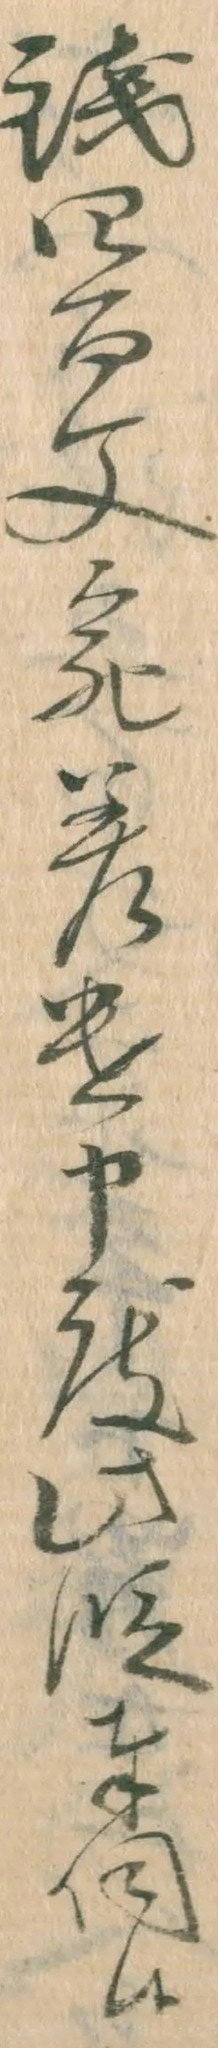銭四百文宛差遣申度此段奉伺候
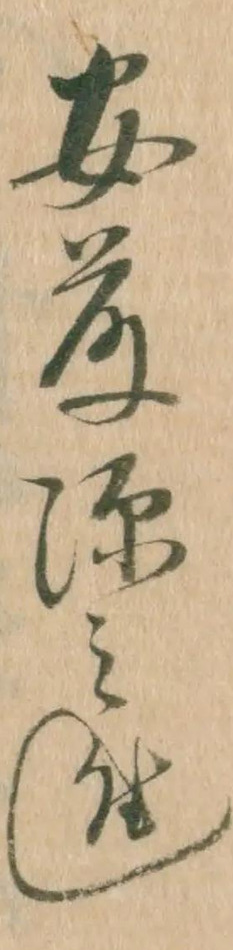安藤源之進
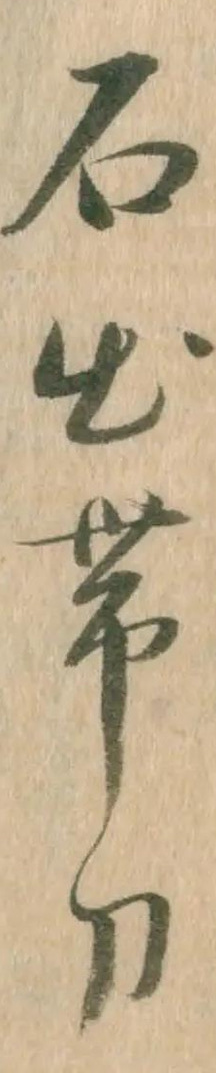石出帯刀

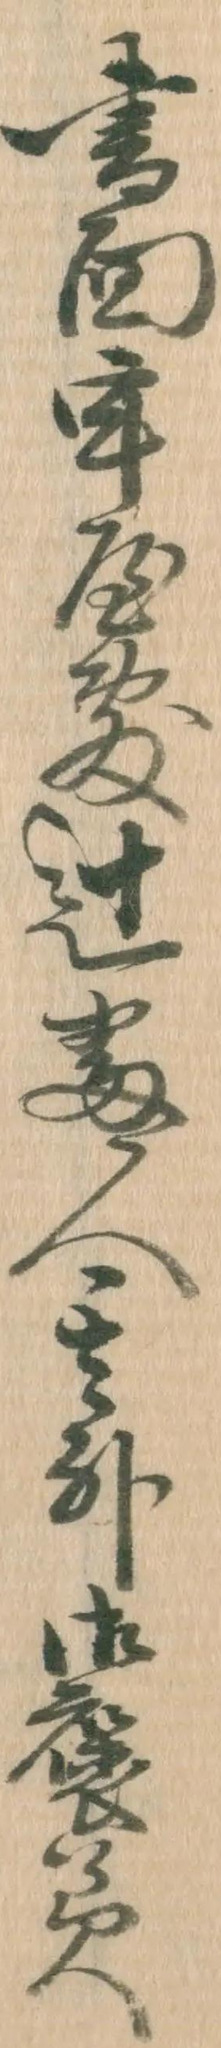書面牢屋敷辻番人其外御褒美
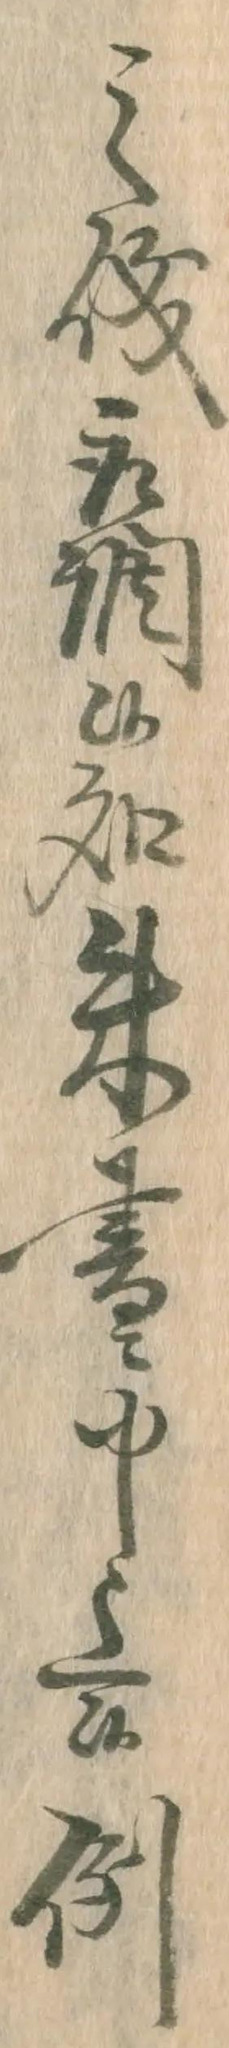之儀取調候処朱書ニ申上候例ニ
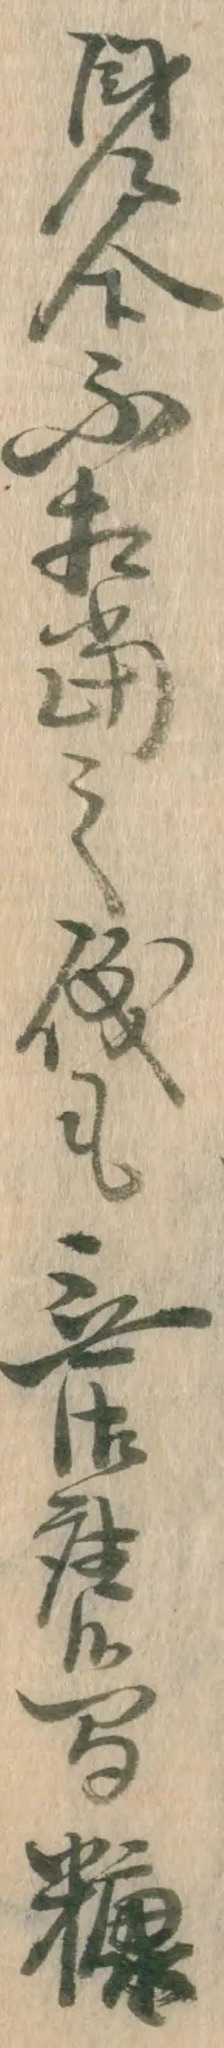巳見合不相当之儀も無御座候間糠
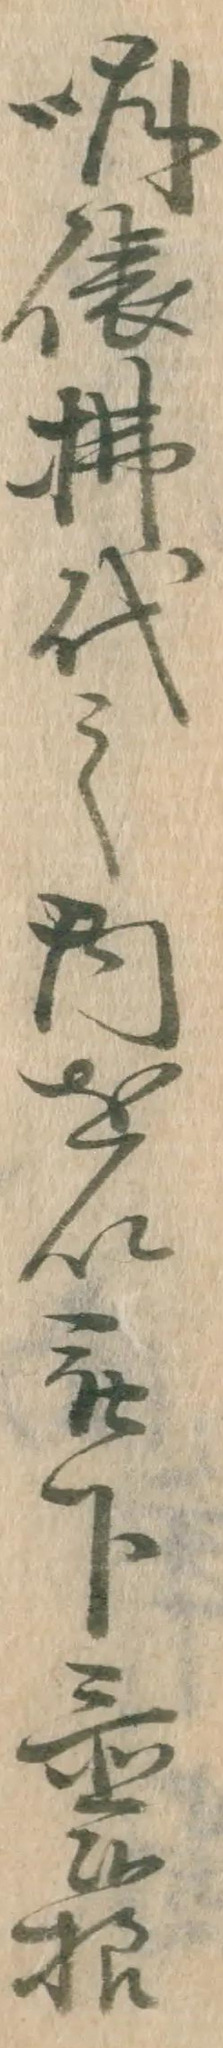明俵払代之内を以被下置候様
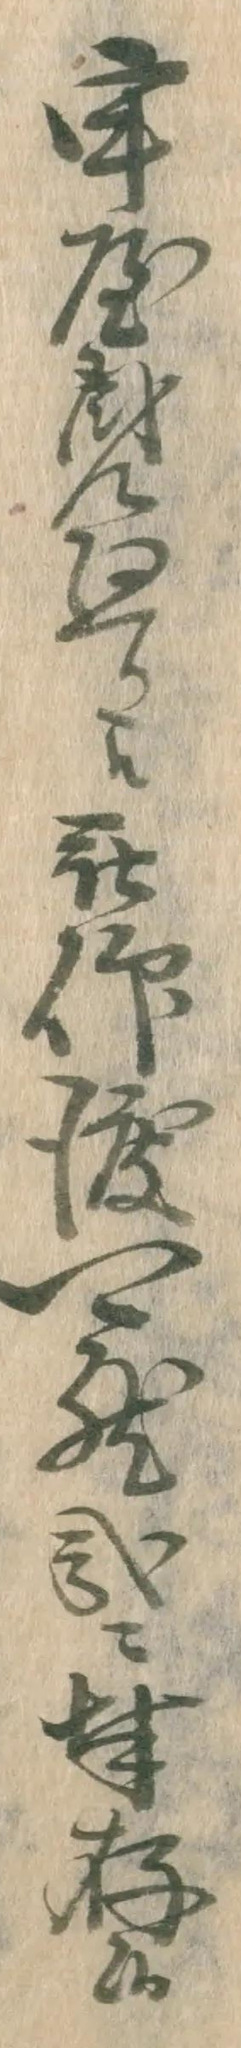牢屋見廻りえ被仰渡可然哉ニ奉存候
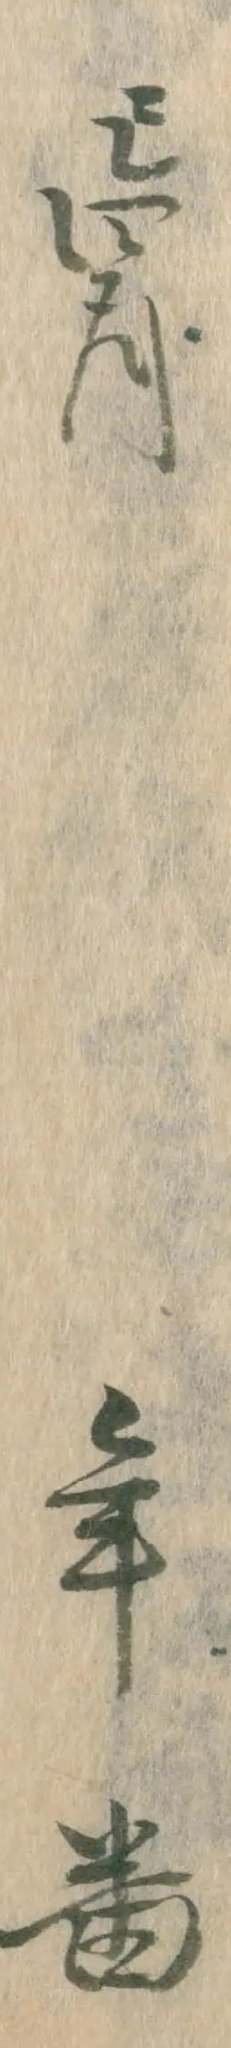巳四月年番

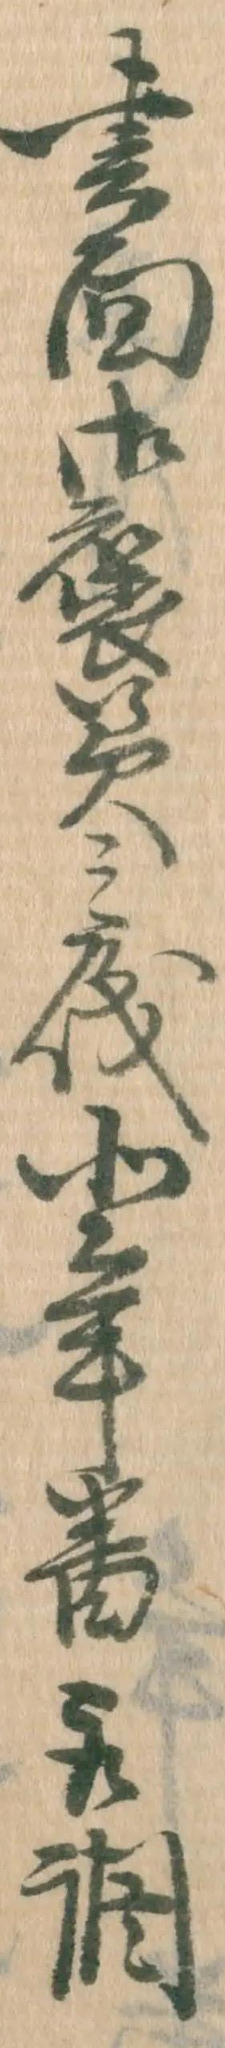書面御褒美之儀北年番被調
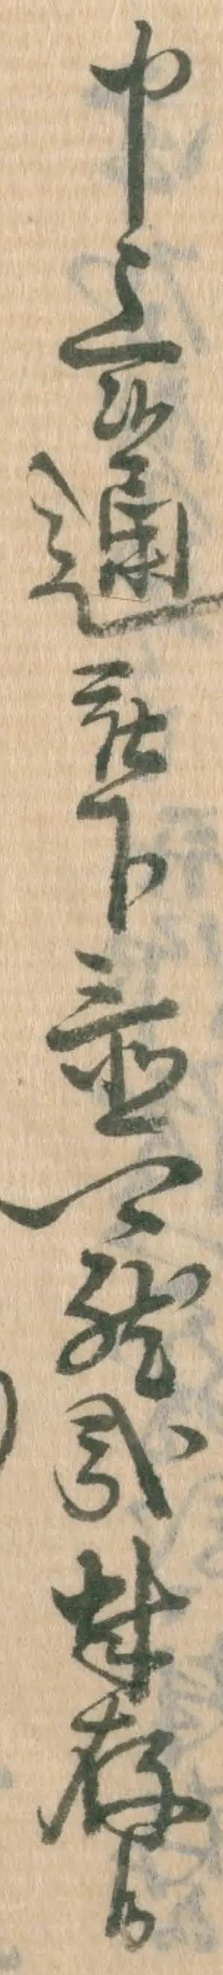申上候通被下置可然哉奉存候
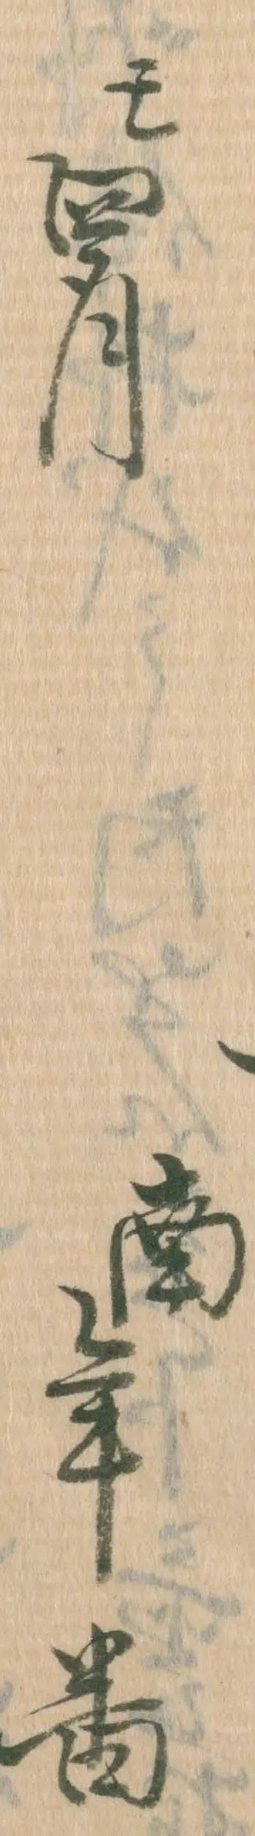巳四月南年番
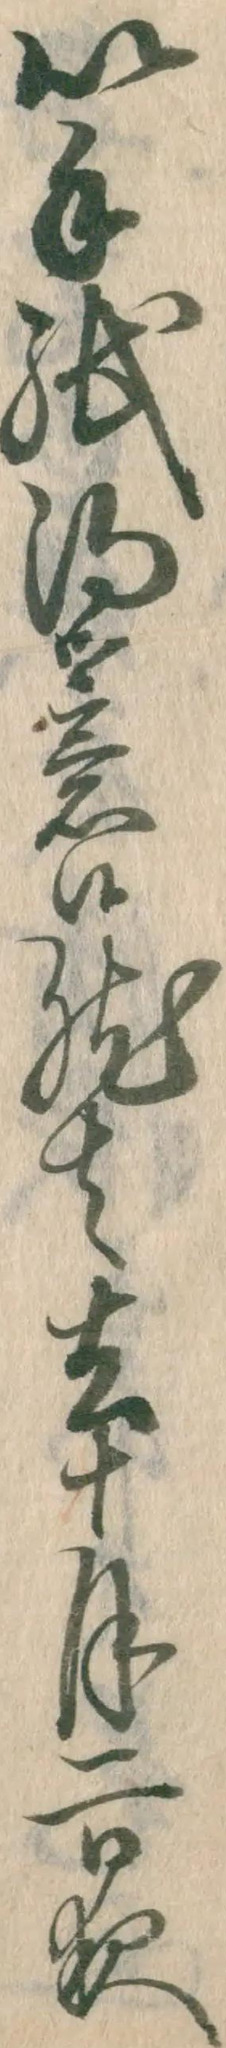以手紙得御意候然は去十月二日夜
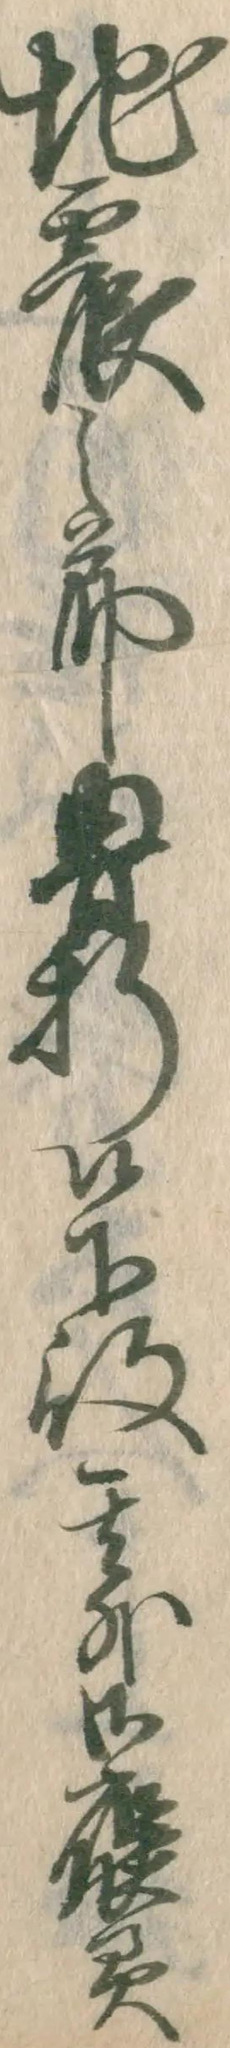地震之節骨折候下役其外御褒美

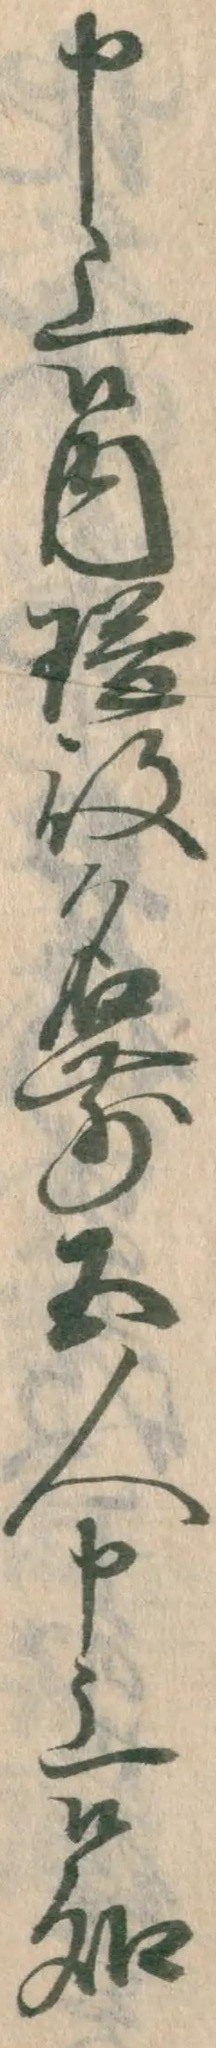申上候内鎰役名前五人申上候処
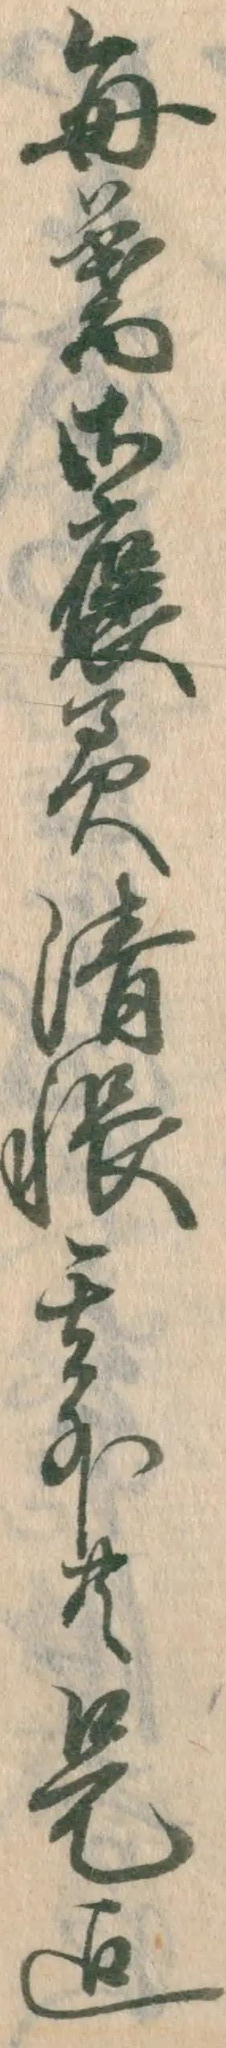毎暮御褒美請帳其外共是迄
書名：七十冊物類集 71巻. [44] 四十三 牢屋敷御普請御修覆地震ニ付骨折候牢屋掛御褒美之部
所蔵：国立国会図書館 National Diet Library, JAPAN
